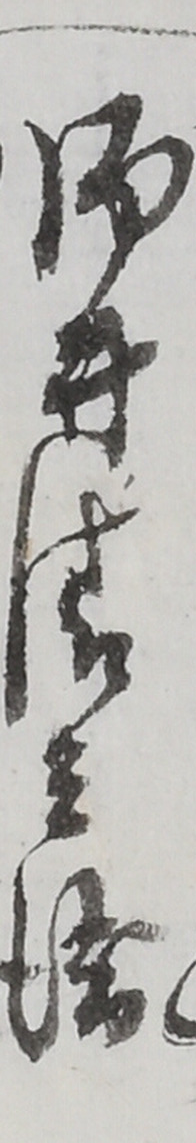酒井清兵衛
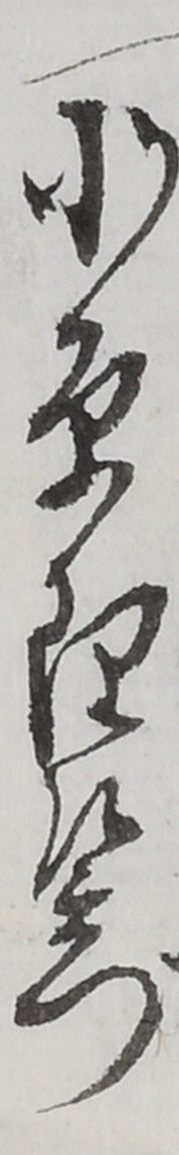小林藤左衛門
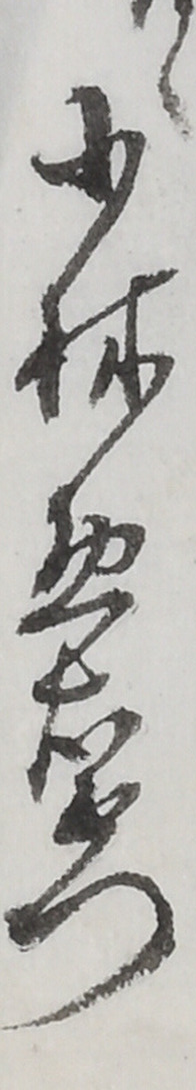小林藤左衛門

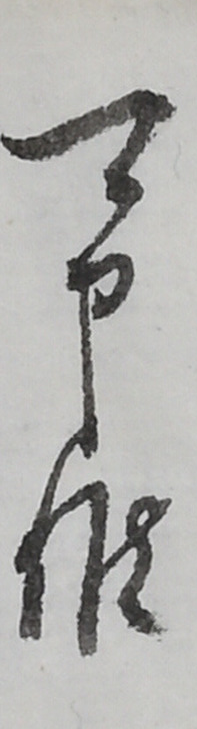可申候
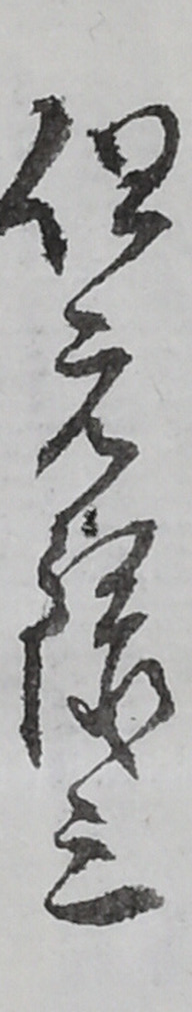但元禄三
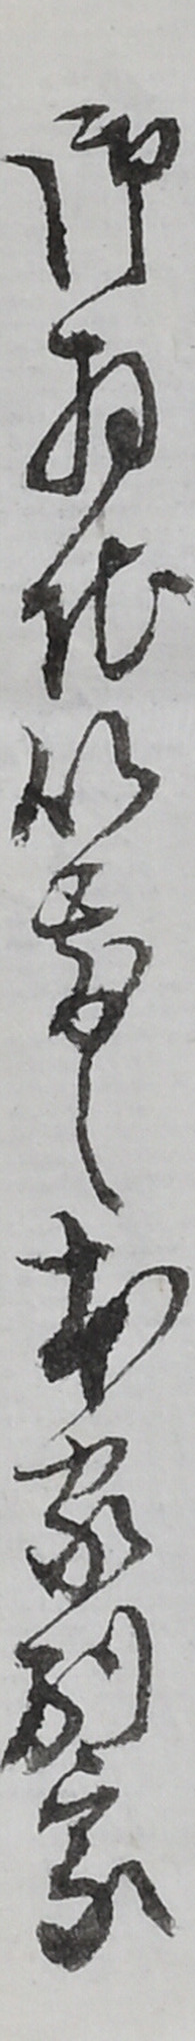御拝地以前之本家別家
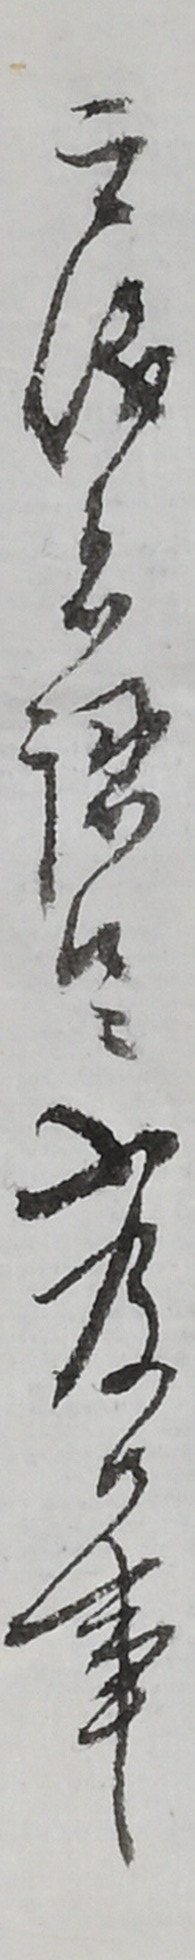之儀は認候ニ不及候事
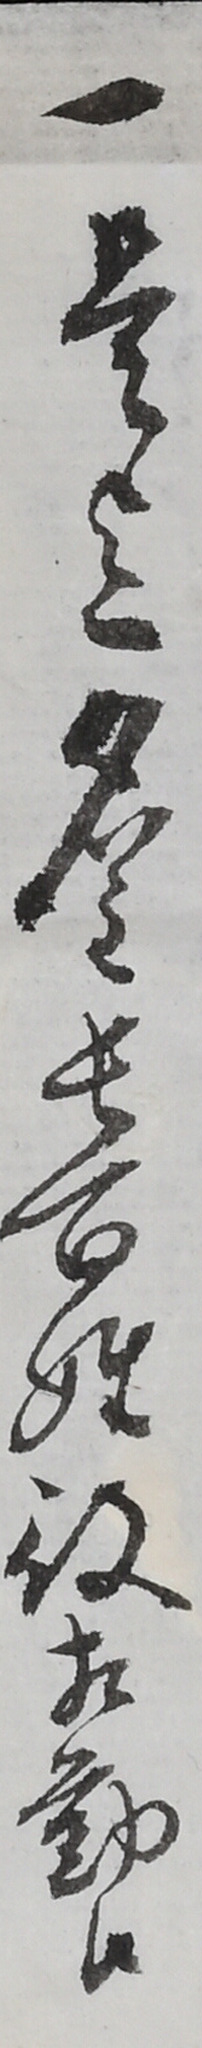一是迄名主長百姓役相勤候
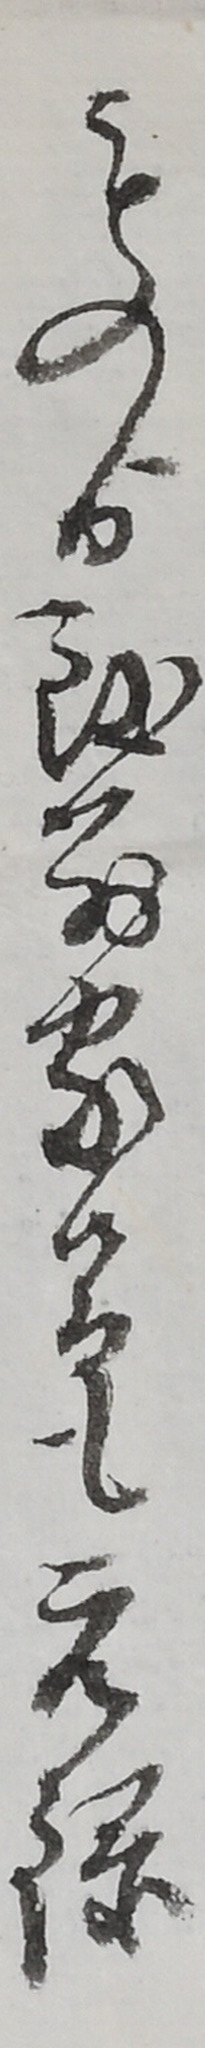ものゟ致別家候而も元禄
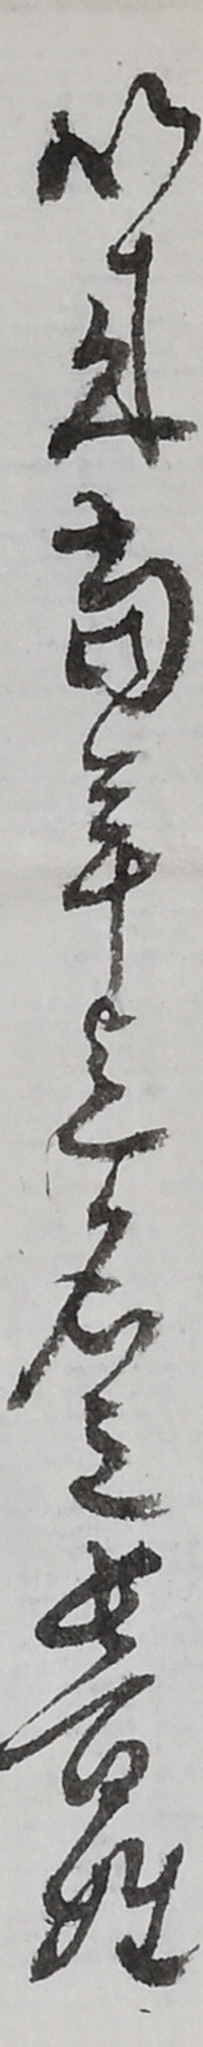以来当年迄名主長百姓
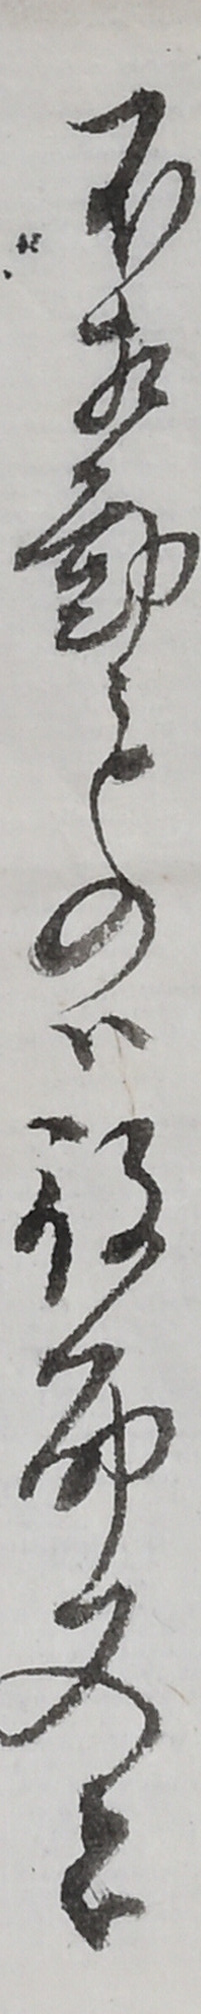不相勤ものハ役筋又は
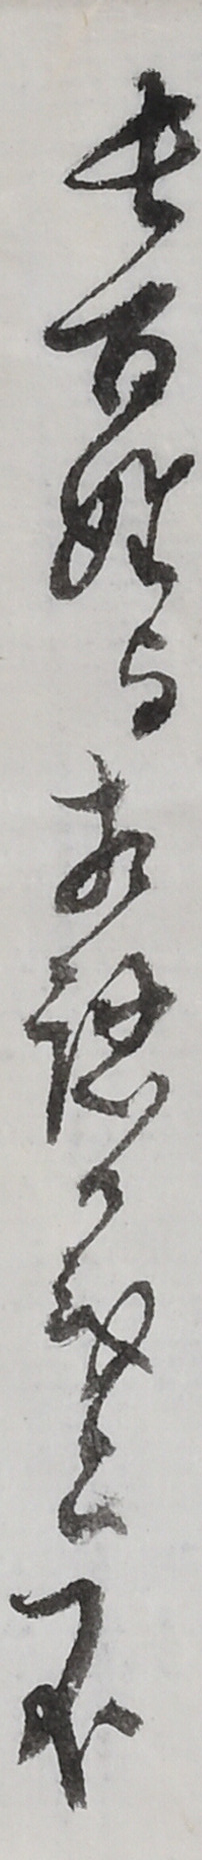長百姓と相認候義は不
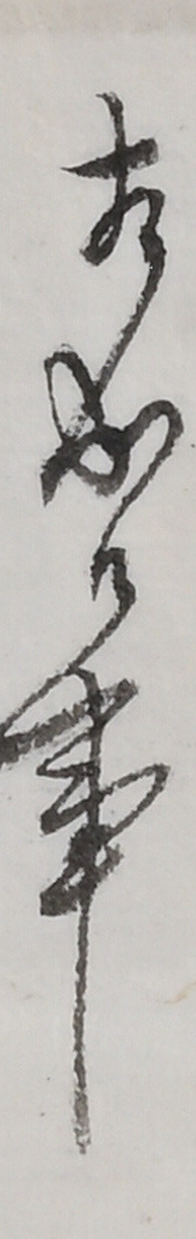相成候事
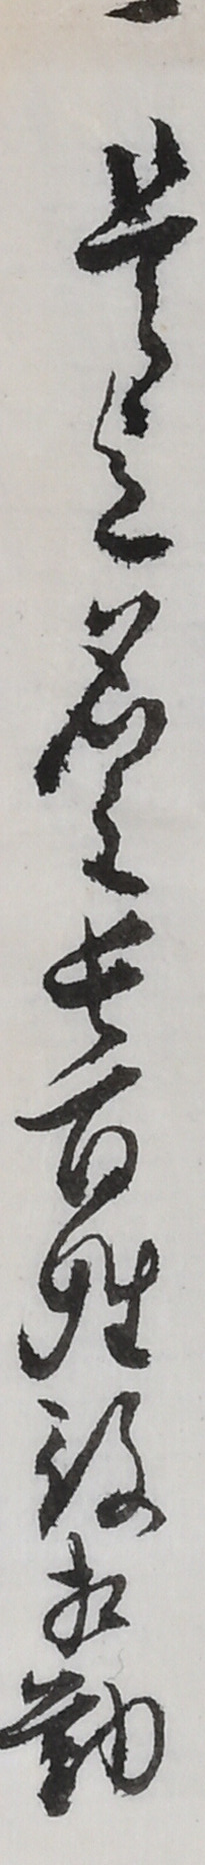一是迄名主長百姓役相勤
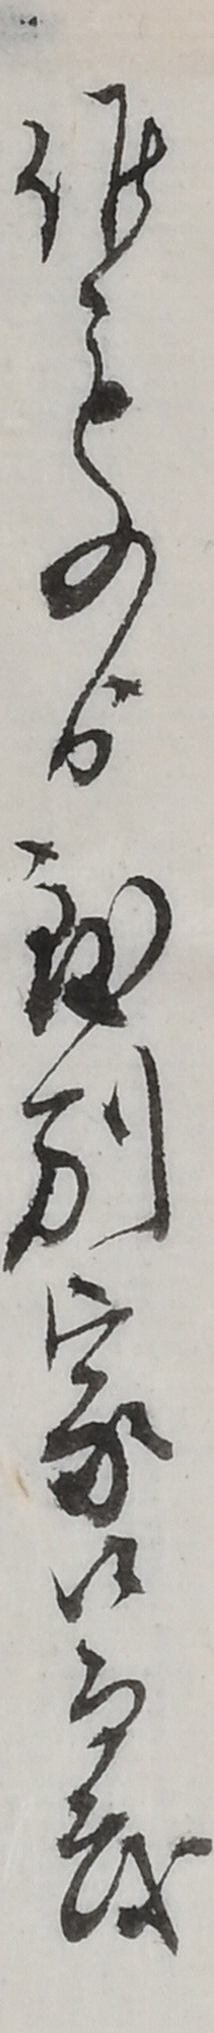候ものゟ致別家候而も
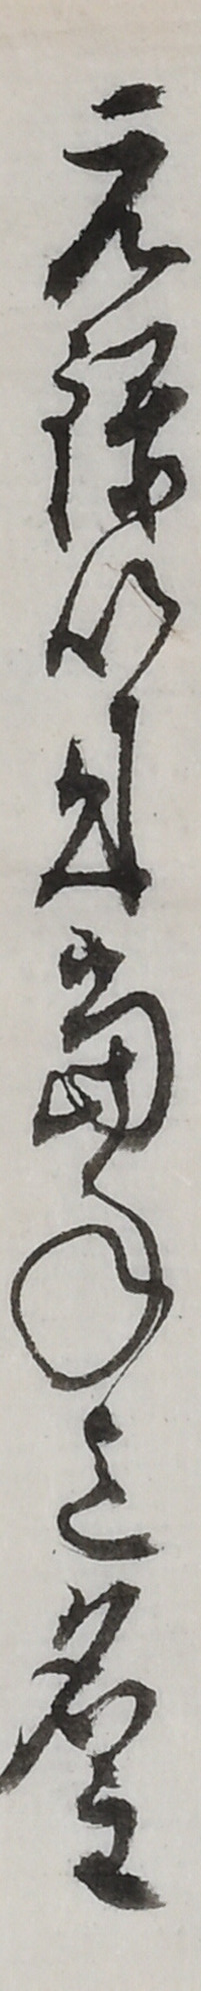元禄以来当年迄名主
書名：百五拾年御祝御用手控
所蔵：伊那市立高遠町図書館・合同会社AMANE
